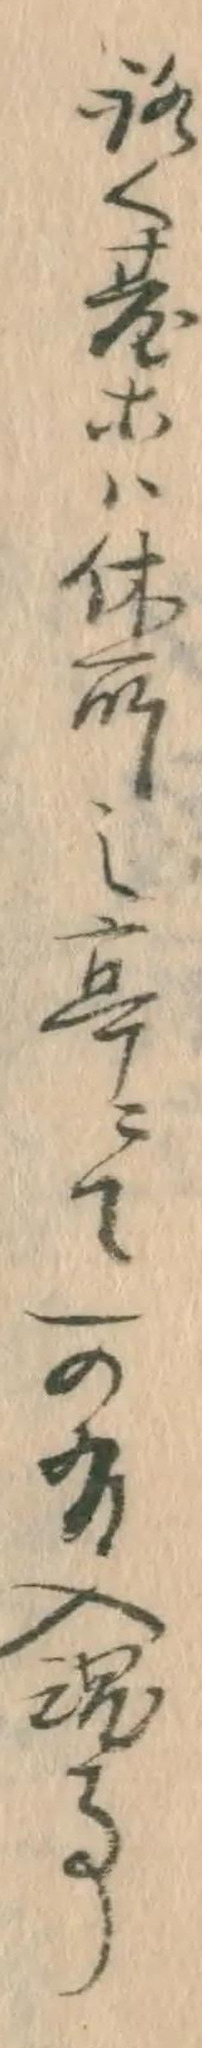ろく臺等ハ休所之亭ニて可有入魂事
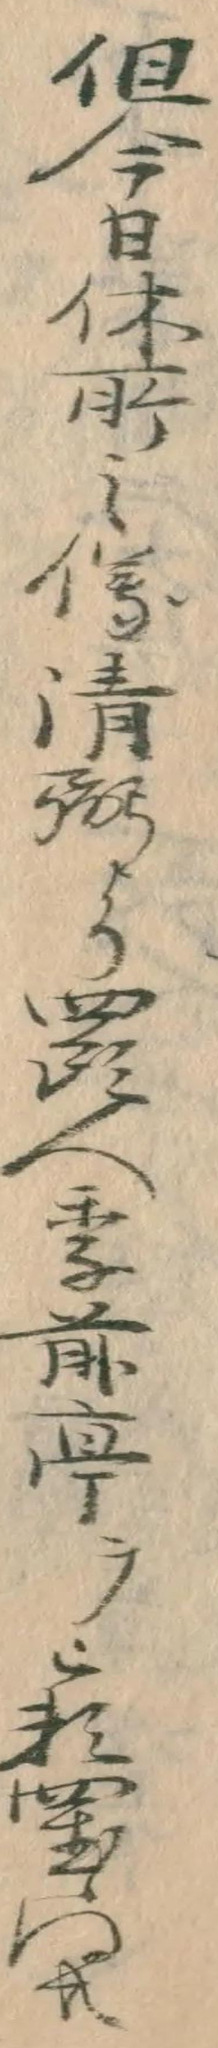但今日休所之儀清弼より四頭人季前亭ヲ被頼置候得共
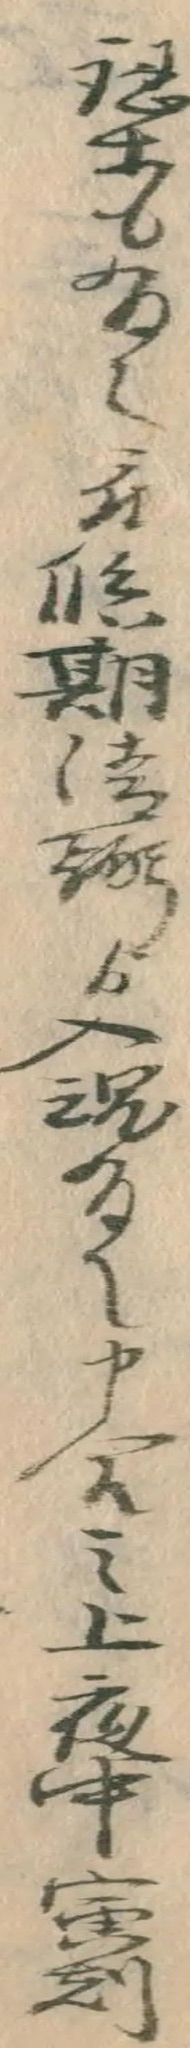認等も有之ニ付臨期清弼ゟ入魂有之申合之上夜中寅刻
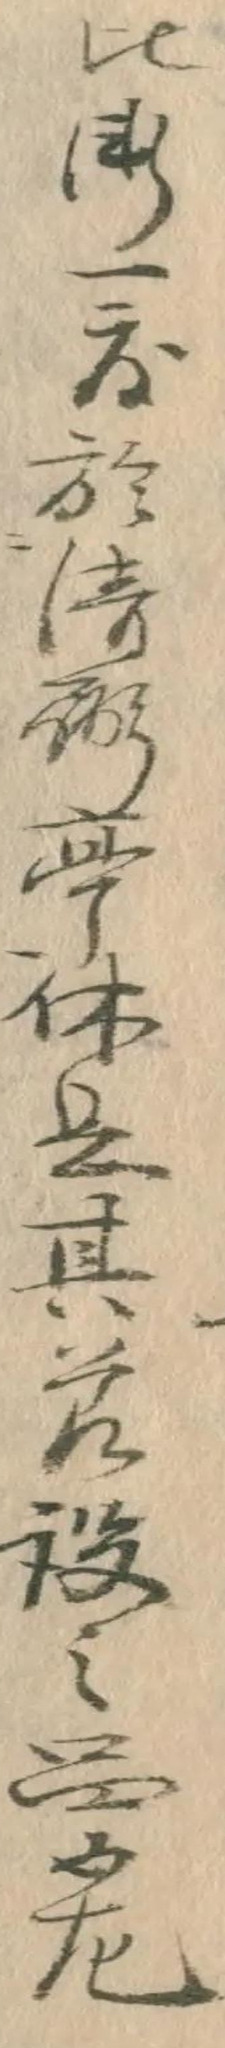比漸一度於清弼亭休息其節設之品如来左

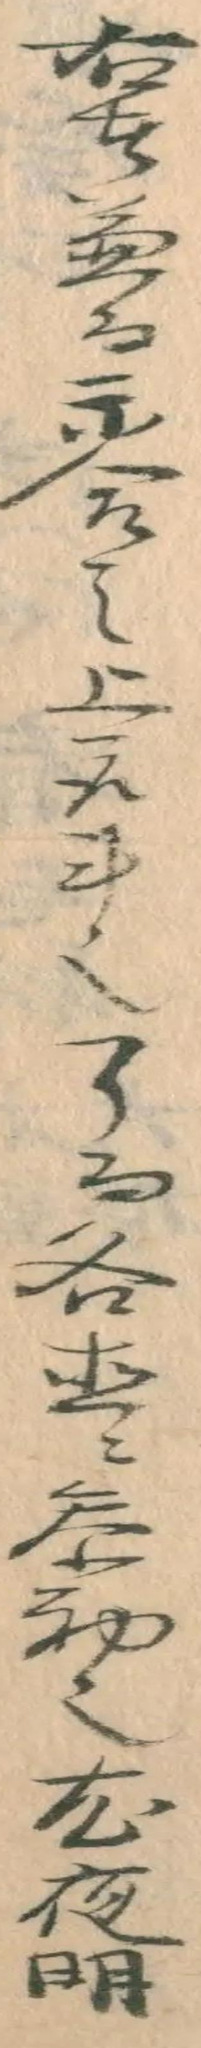右は兼而示合之上取斗也了而各直ニ参勤之尤夜明
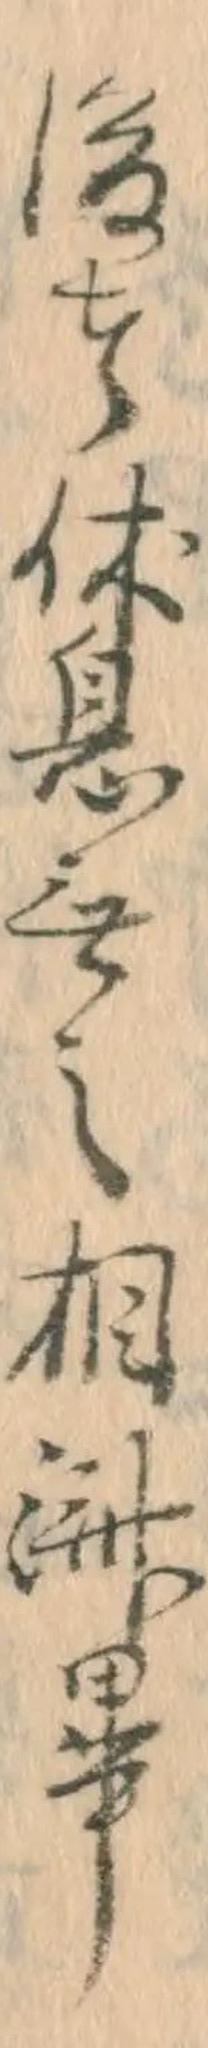後は休息無之相済畢
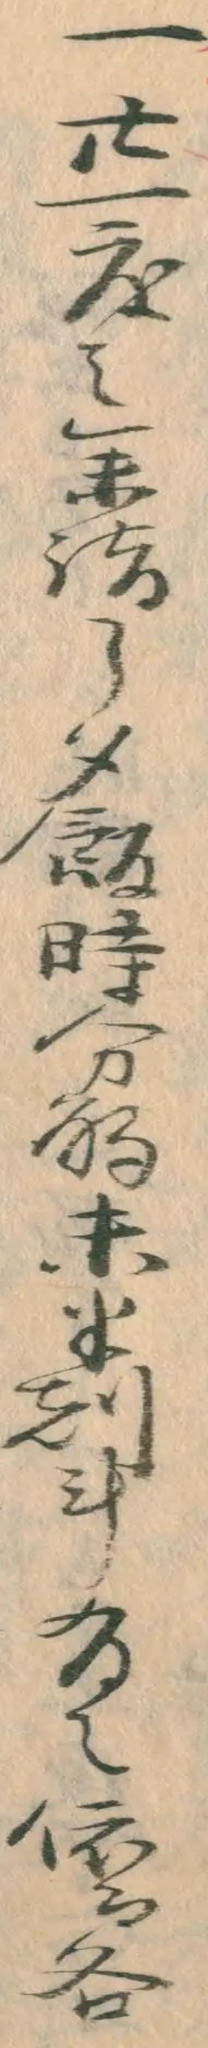一廿一度之参詣了夕飯時分触未半刻斗有之依而各
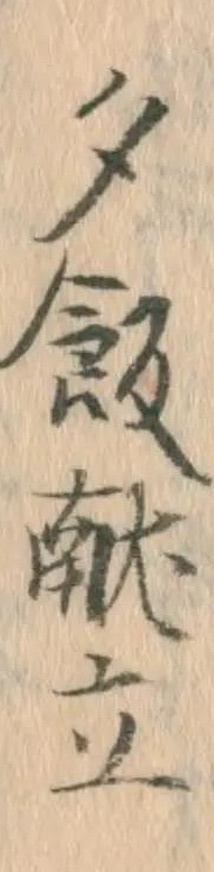夕飯献立
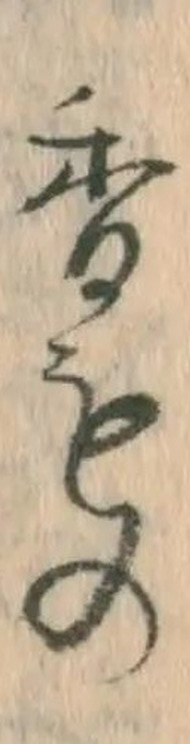香もの
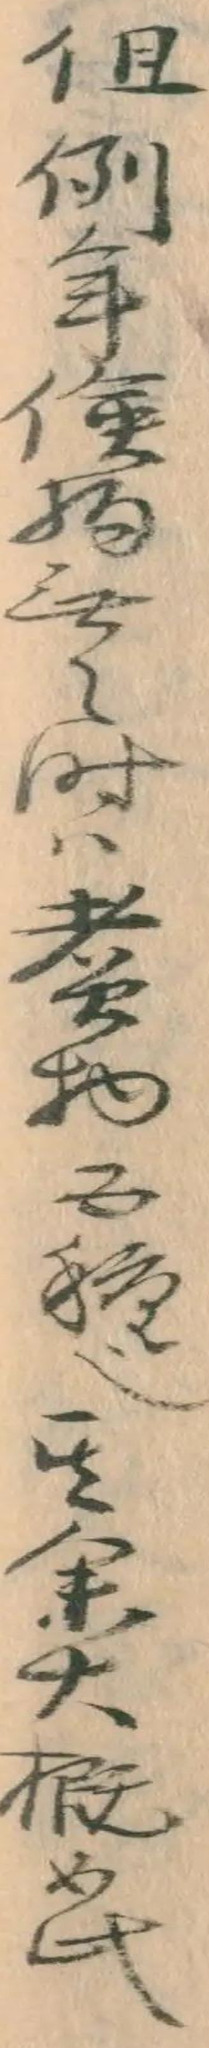但例年倹約無之時ハ煑物五種也其余大概如此
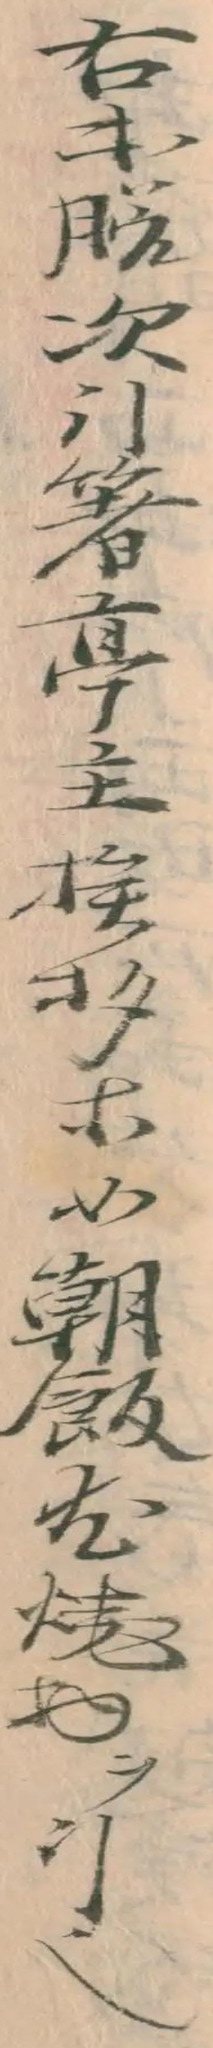右本膳次引著亭主挨拶等如朝飯尤焼物ヲ引也
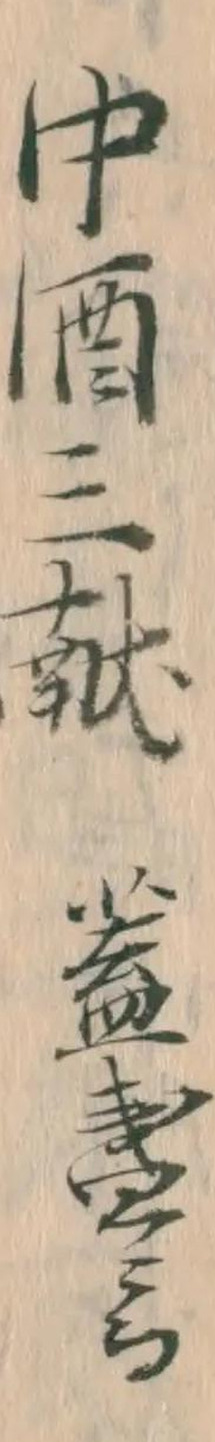中酒三献蓋盞ニ而
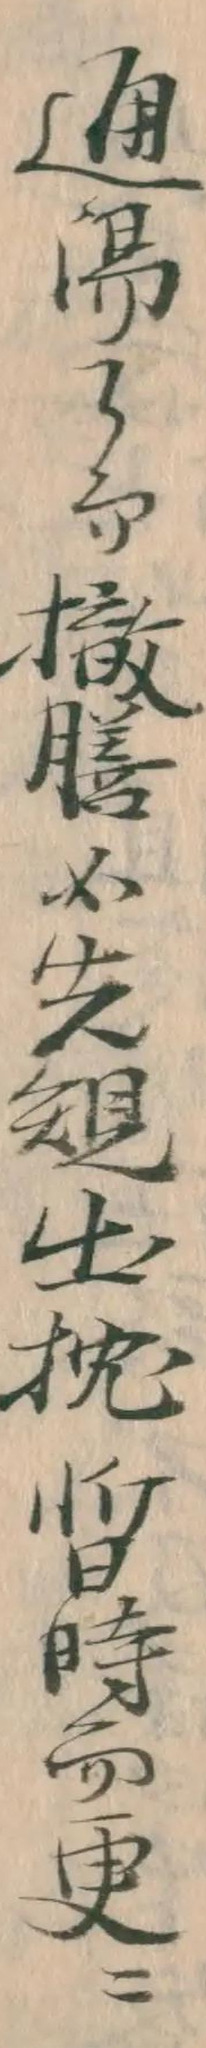通湯了而撤膳如先規出枕暫時而更ニ
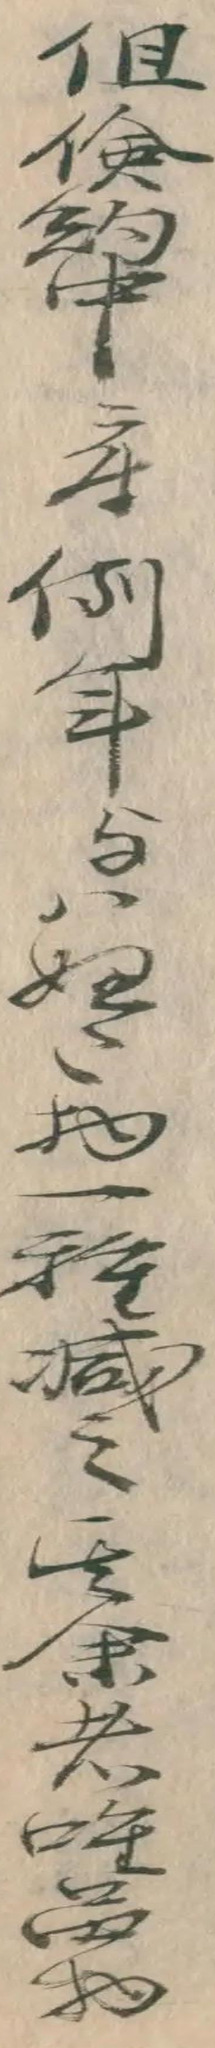但倹約中ニ付例年与ハぬた物一種減之其余者味品物
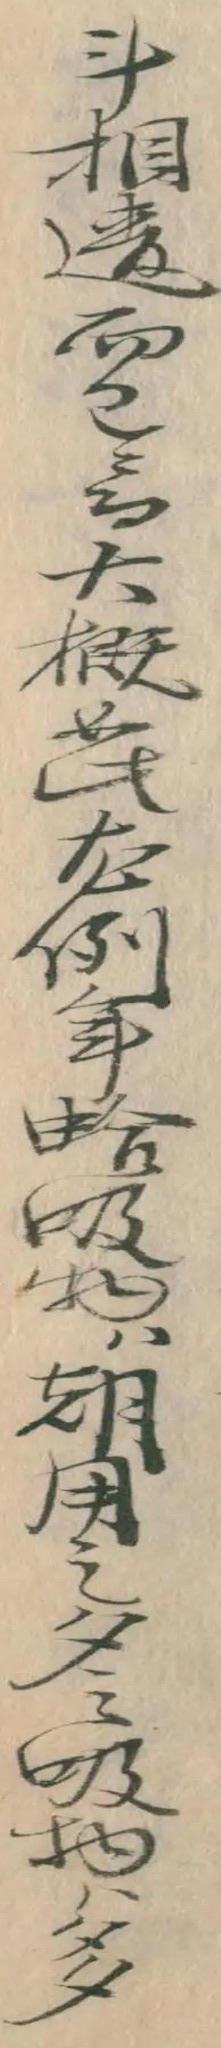斗相違而已ニ而大概如此尤例年蛤吸物ハ朝用之夕之吸物ハ多

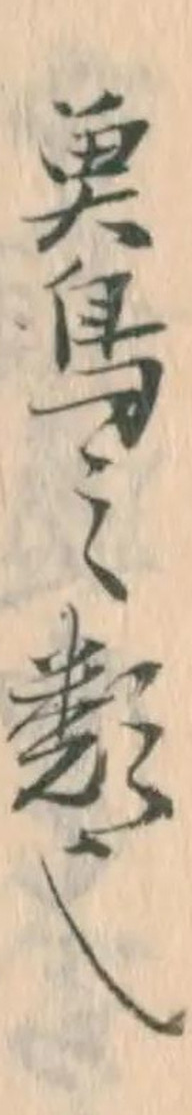魚鳥之類也
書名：賀茂社記録. 第72冊
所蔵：国立国会図書館 National Diet Library, JAPAN
